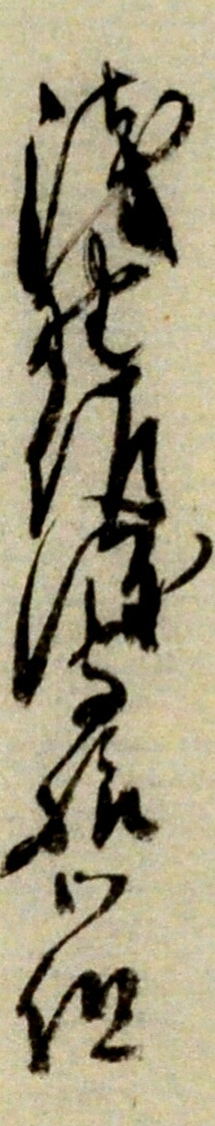浅野佐渡守様御組
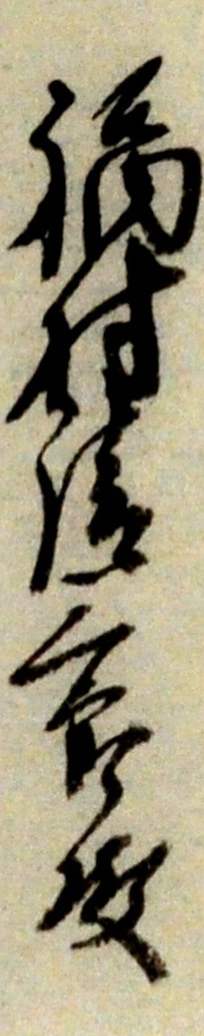福村清三郎殿
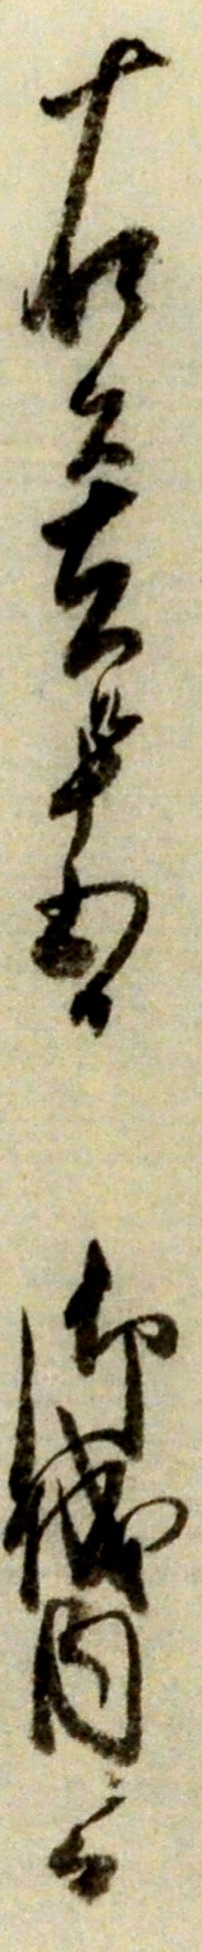右は去ル十五日御城内にて
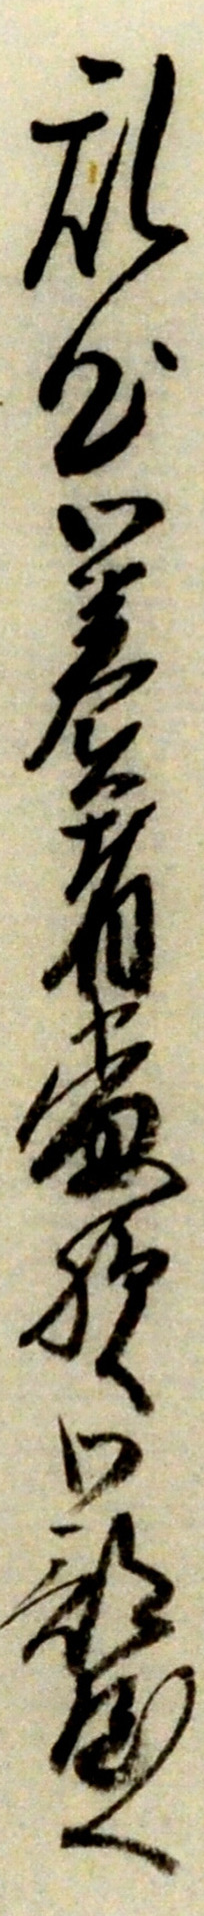乱心御奏者番様御部屋へ
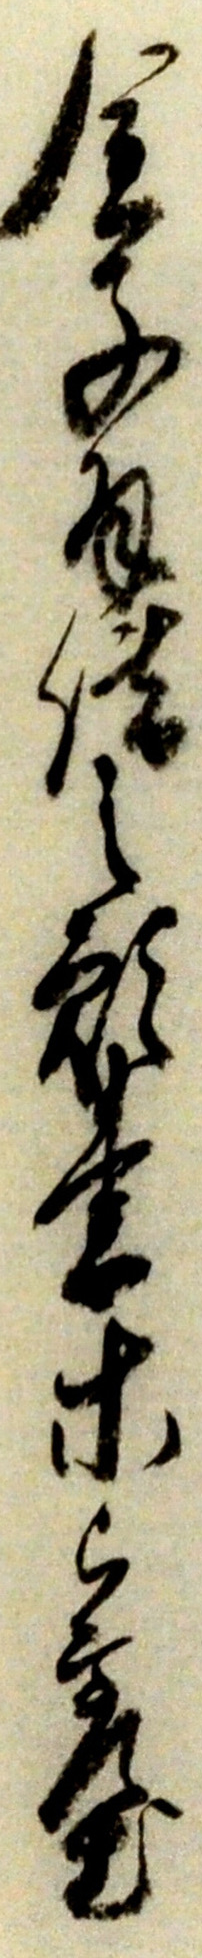金子拝借之願書等被差出
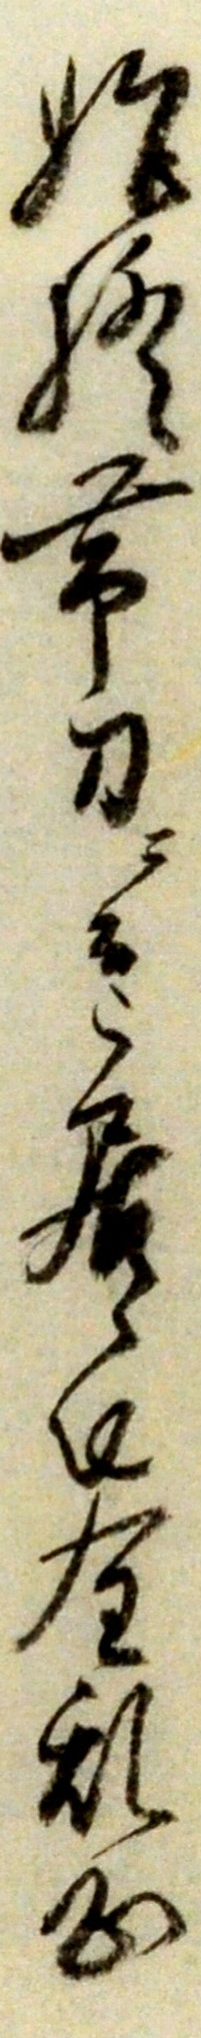始終帯刀にて被候由全乱心
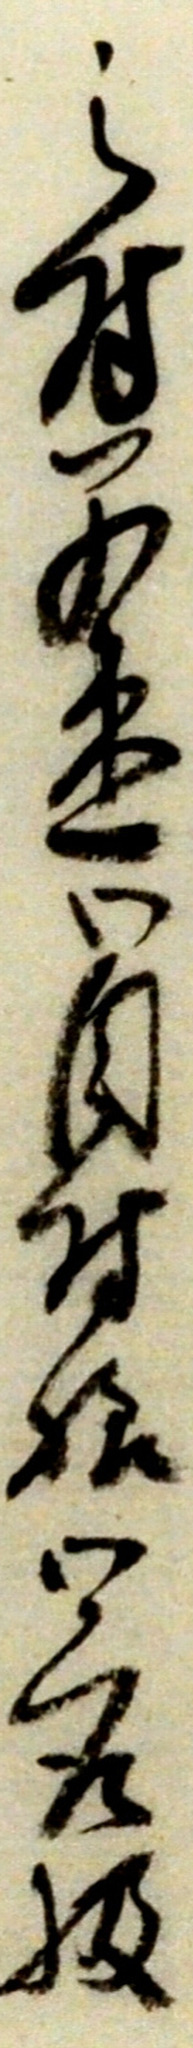に付早速御目付様御取扱
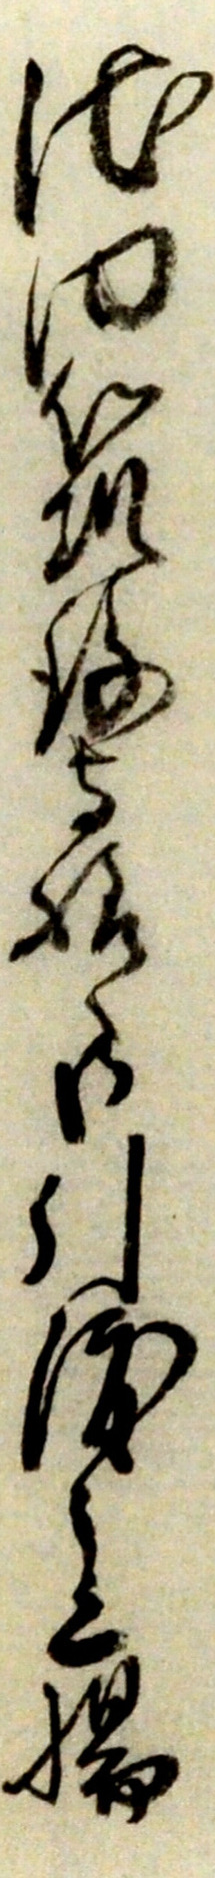池田筑後守様へ御引渡之上揚
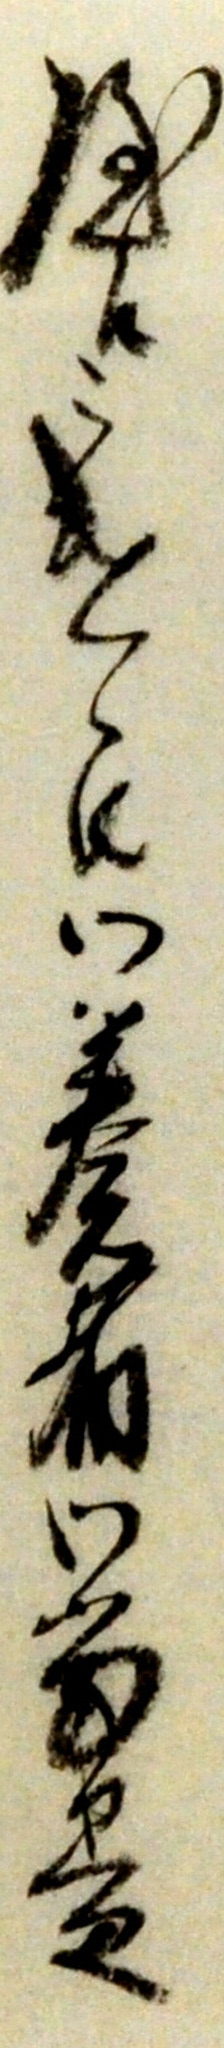屋え被遣候由御奏者御当番
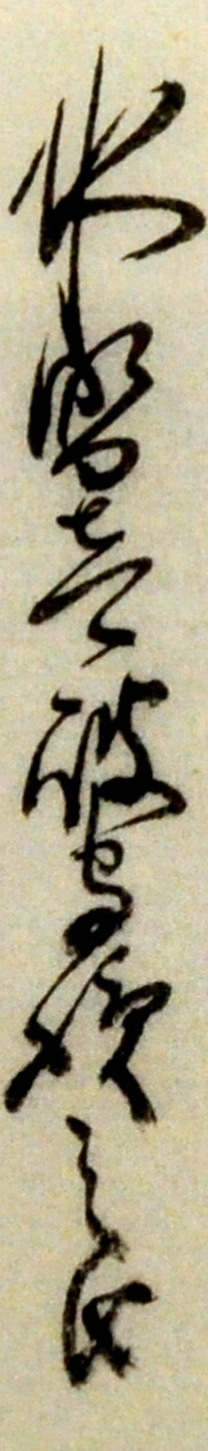水野壱岐守様之由

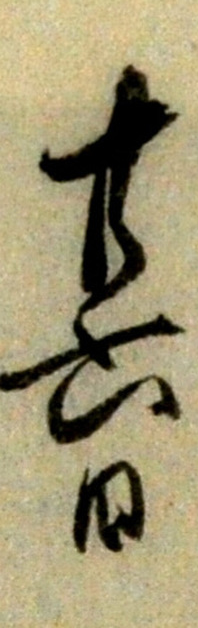廿六日
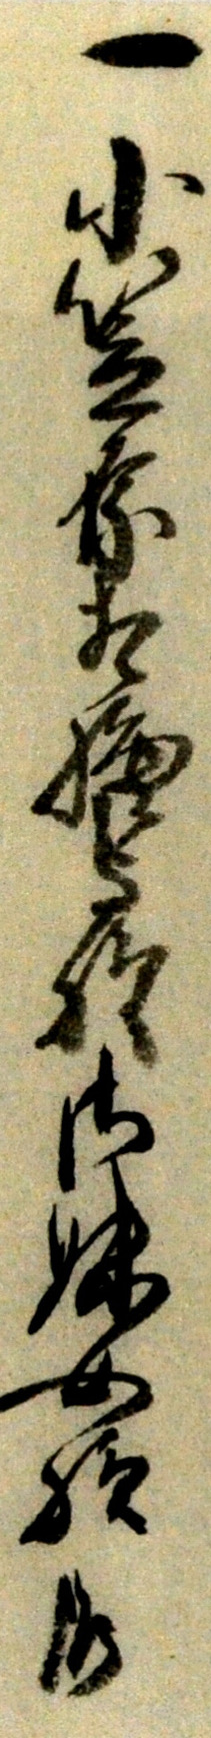一小笠原相模守様御妹女様御
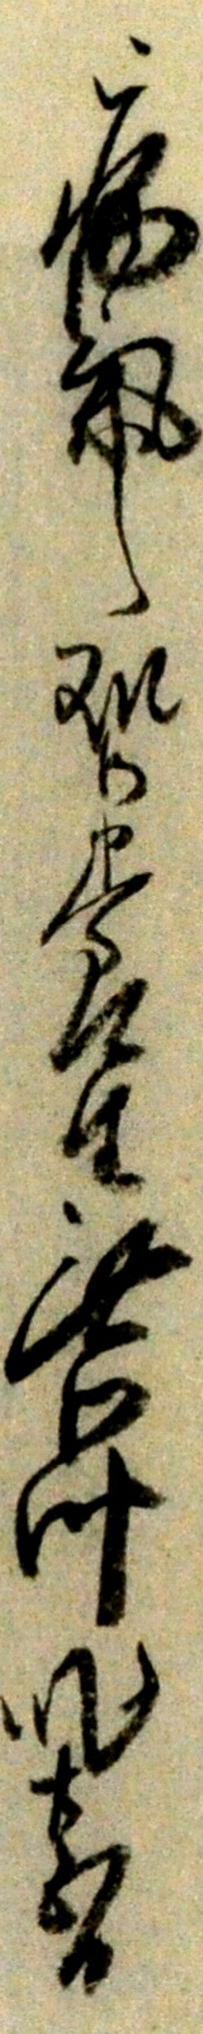病気之処御養生無御叶昨廿五日
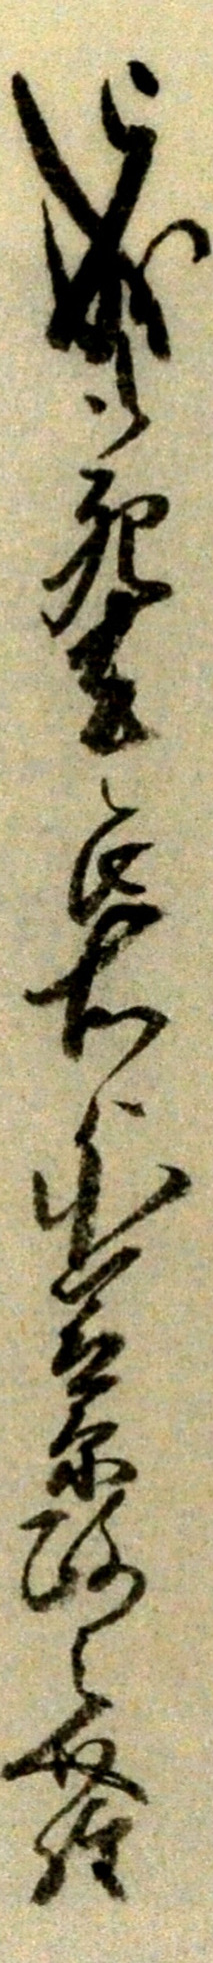被成御死去候由右は小笠原政之介様
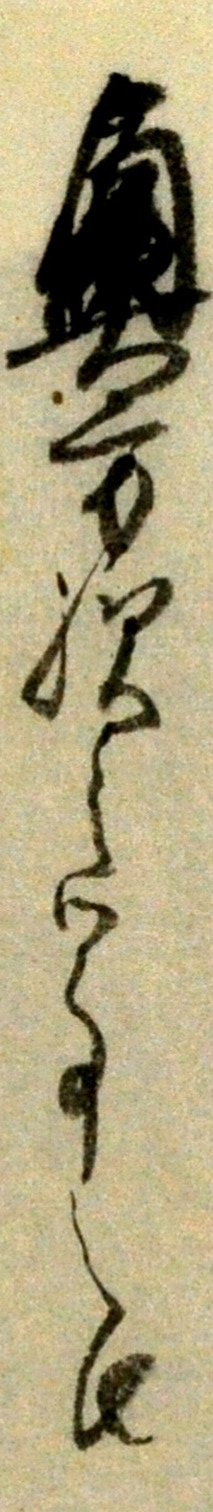奥方様之御事之由
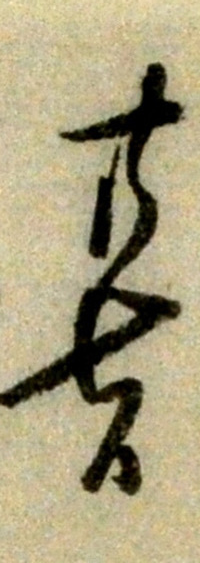廿七日
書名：申合帳〔一括〕
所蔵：伊那市立高遠町図書館・合同会社AMANE
